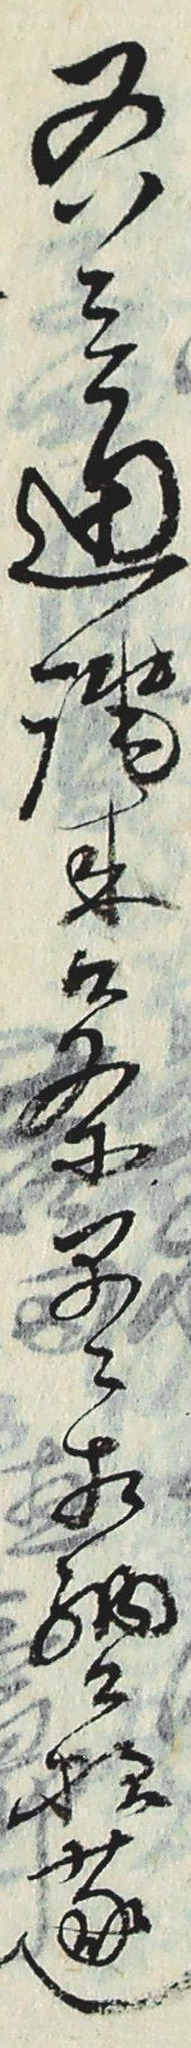右之通誂来候条早々相納候様遂
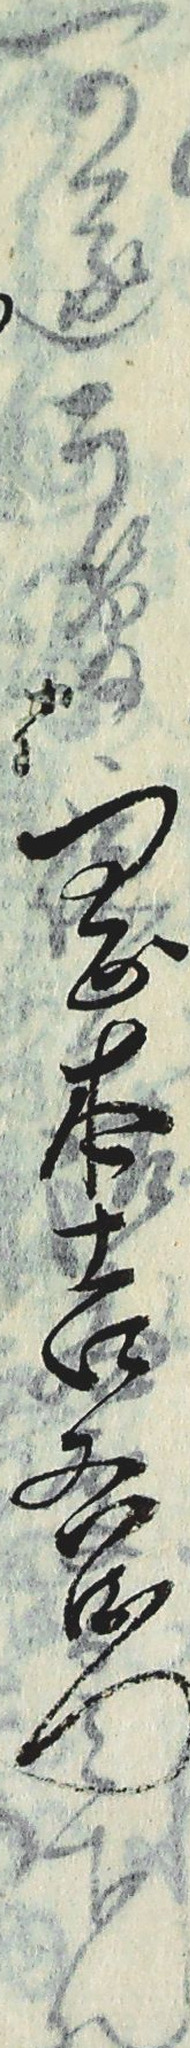岡本吉右衛門
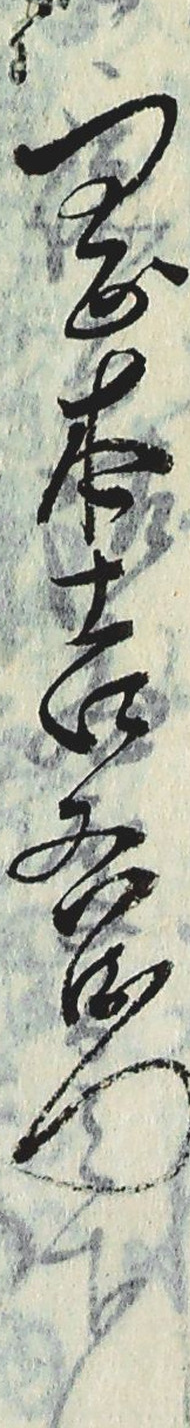岡本吉右衛門
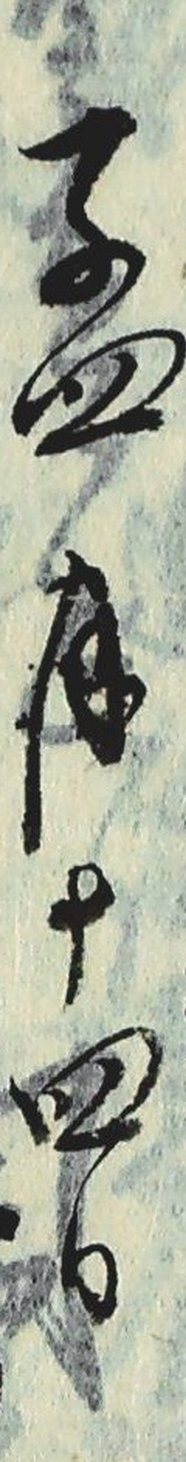子四月十四日
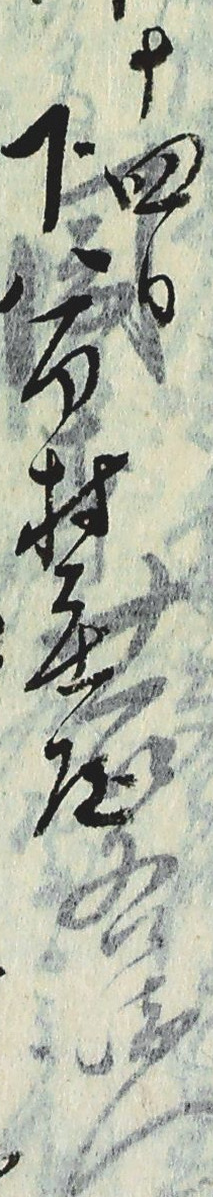下八万村庄屋
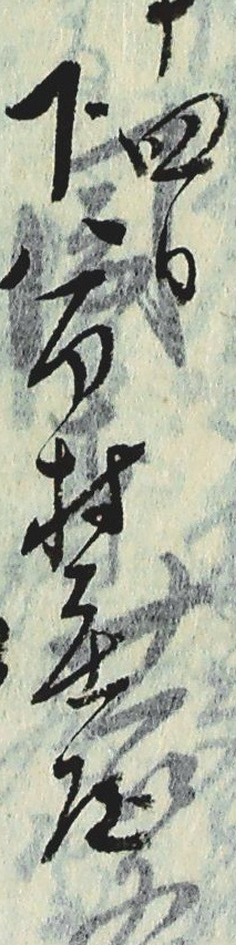下八万村庄屋
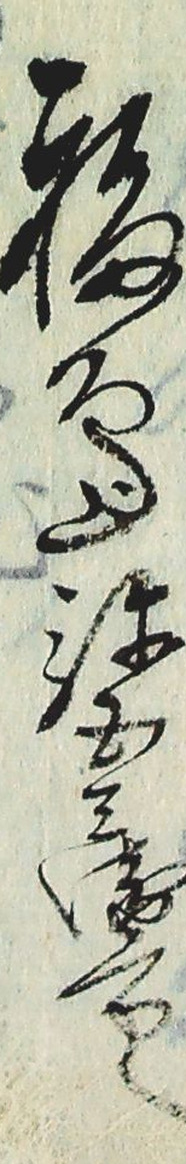福島弥五兵衛方へ
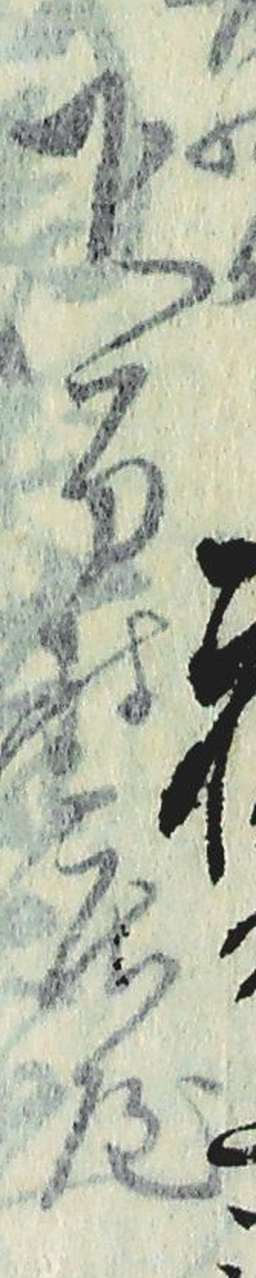下八万村庄屋
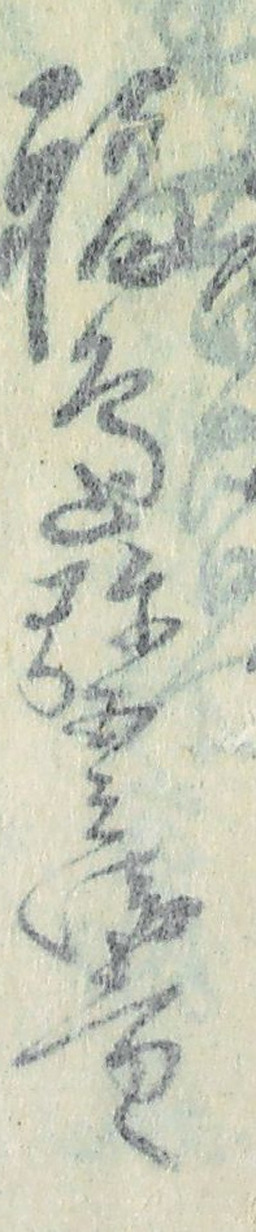福島弥五兵衛方へ
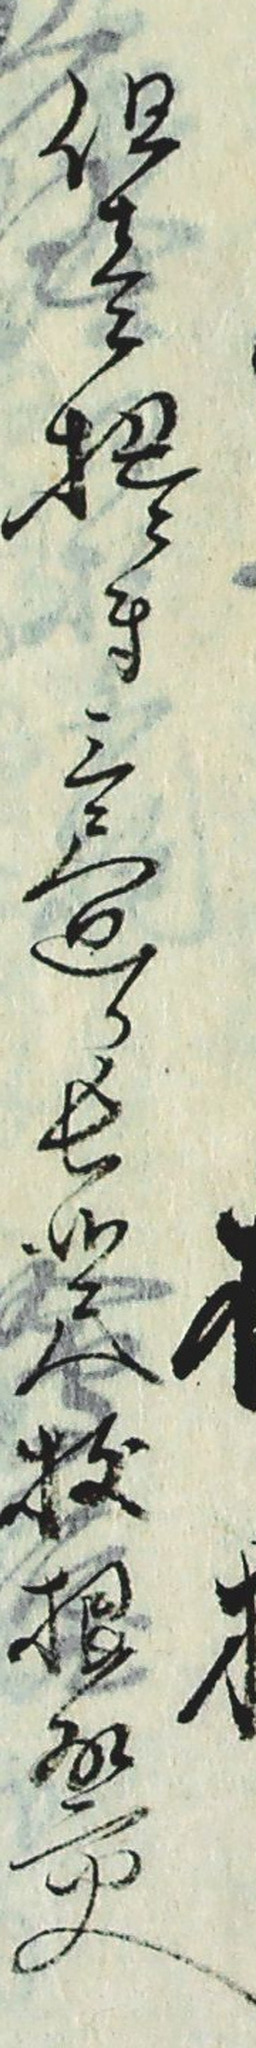但壱把に付三尺廻り長弐尺枝根取交
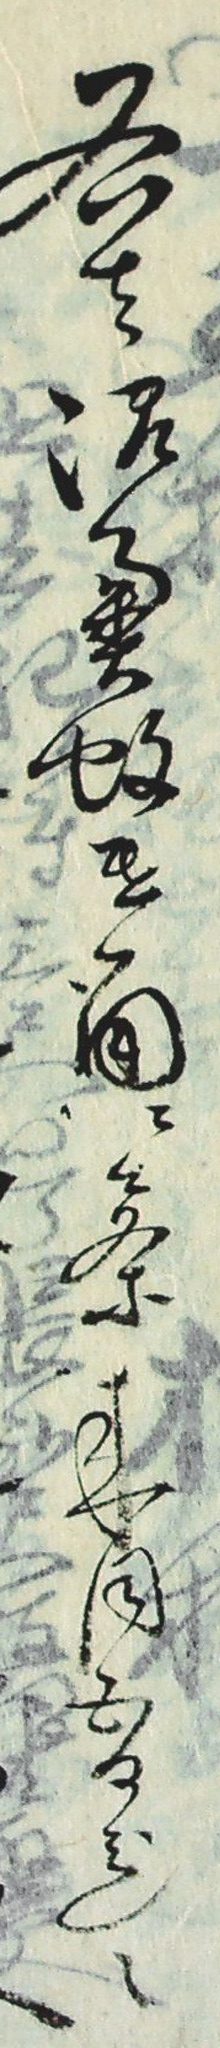右は御奥蚊遣御用に候条来月五日迄に
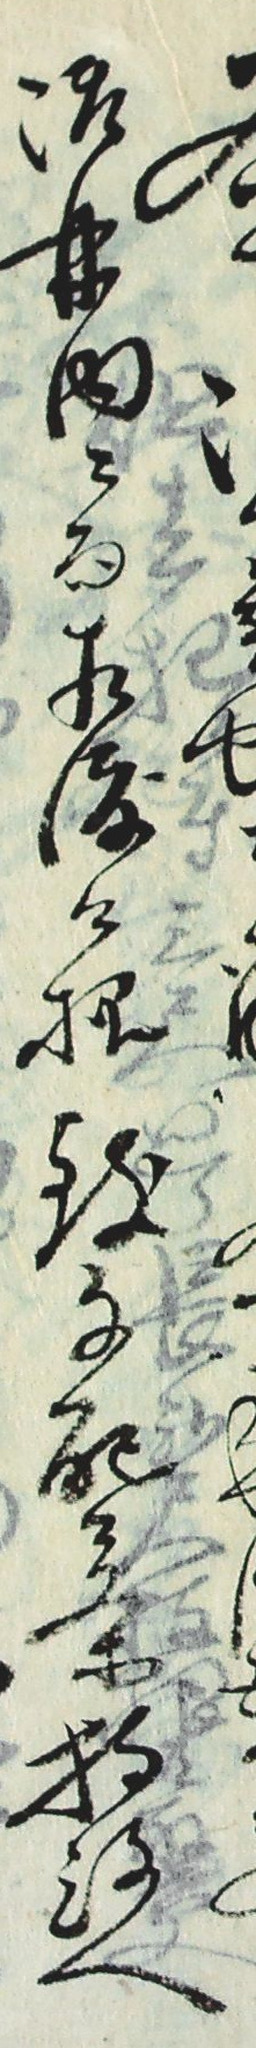御林内にて相渡候様致手配候条持役人
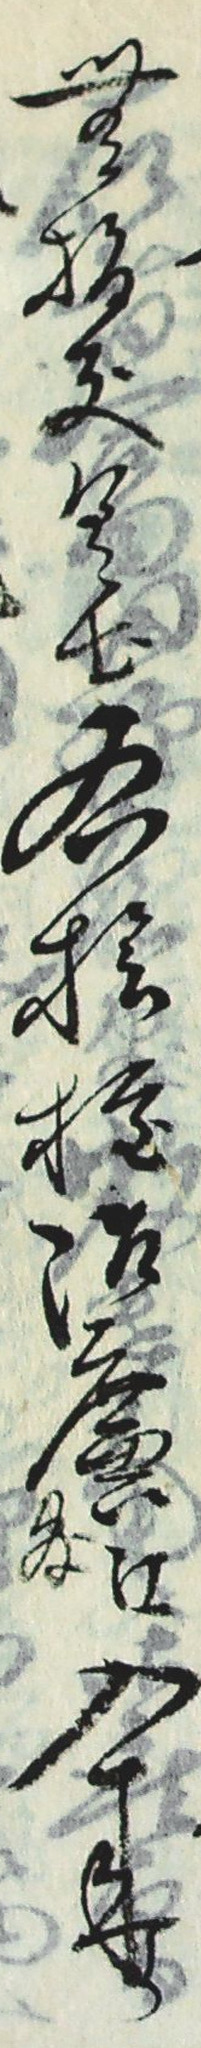無指支差出右桧檀御広敷え入来り
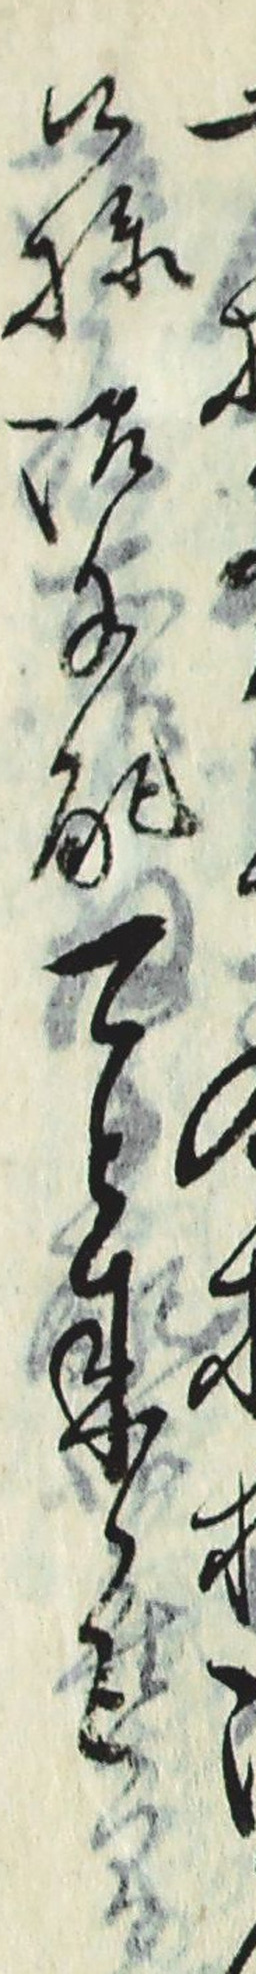候様御手配可被成候以上
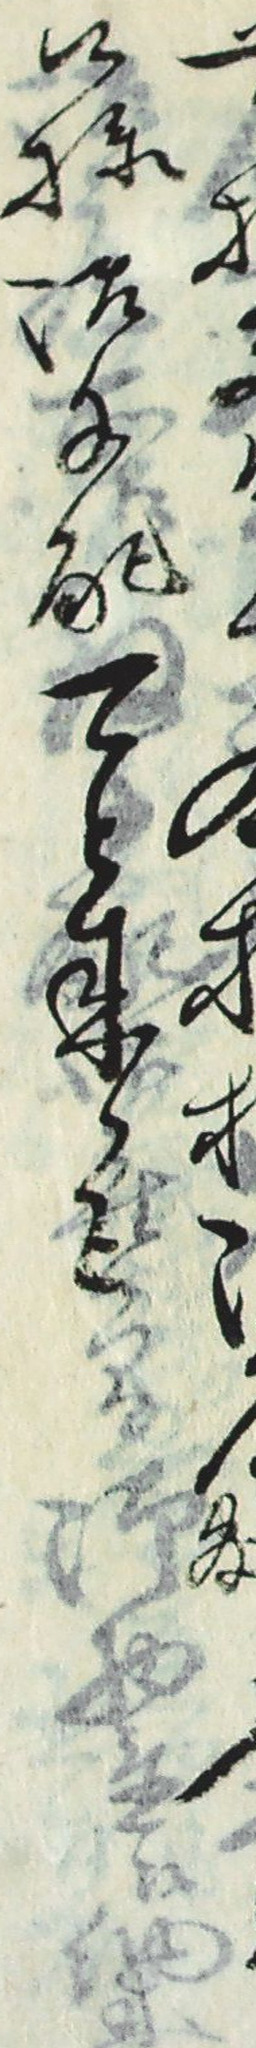候様御手配可被成候以上

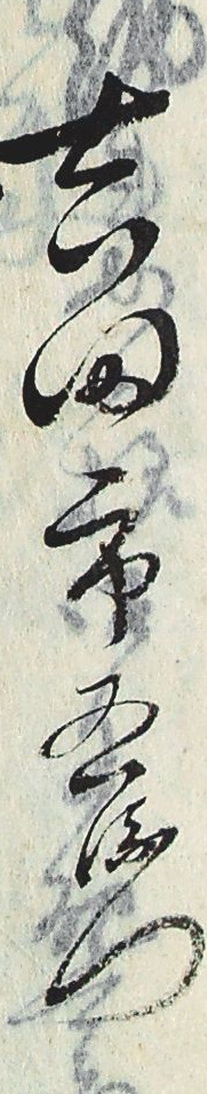吉田市右衛門
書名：名東郡中諸割賦元帳
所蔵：鳴門教育大学 Naruto University of Education
